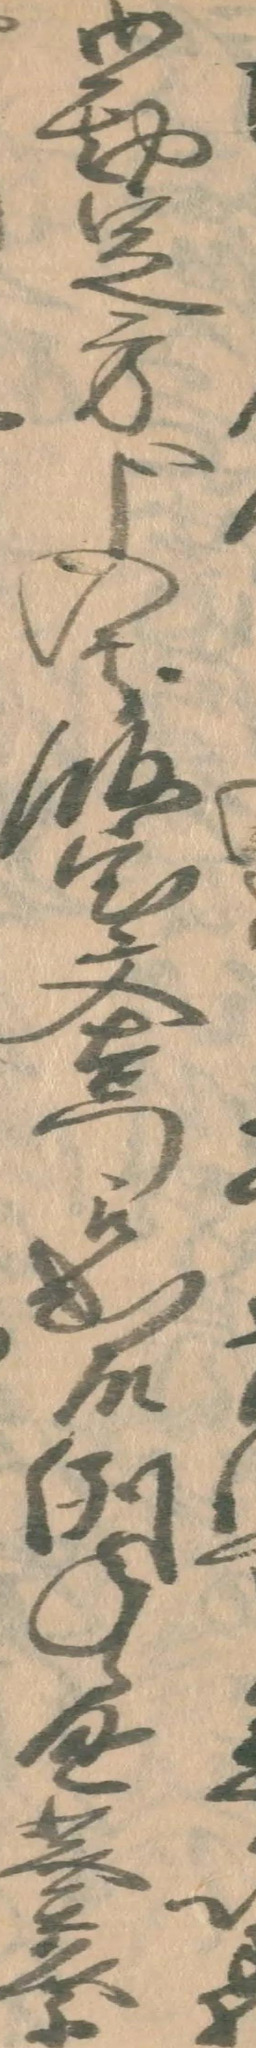御勘定方へ申入処飯室文右衛門被出故例年之通葵祭
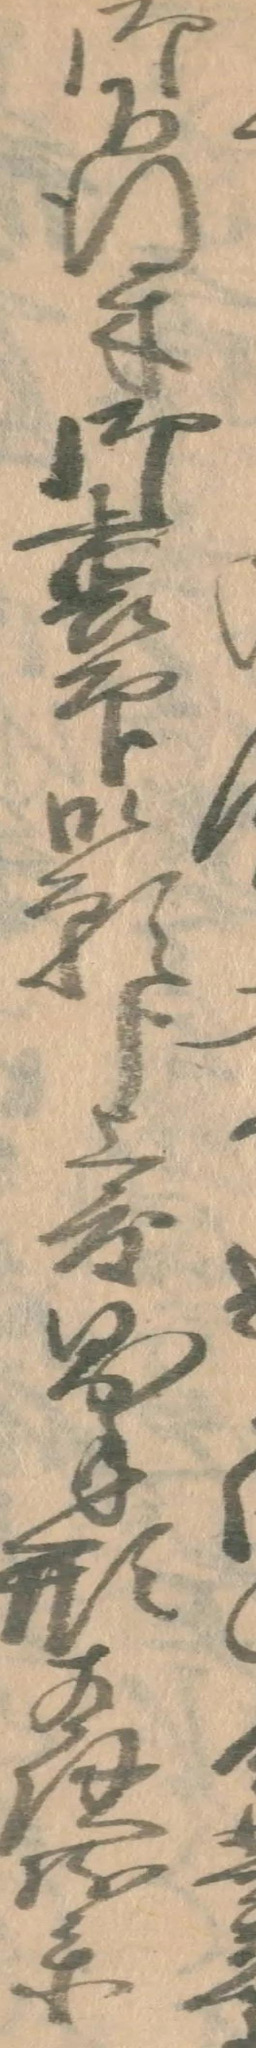御下行米御裏印御願申上度則手形相認持参
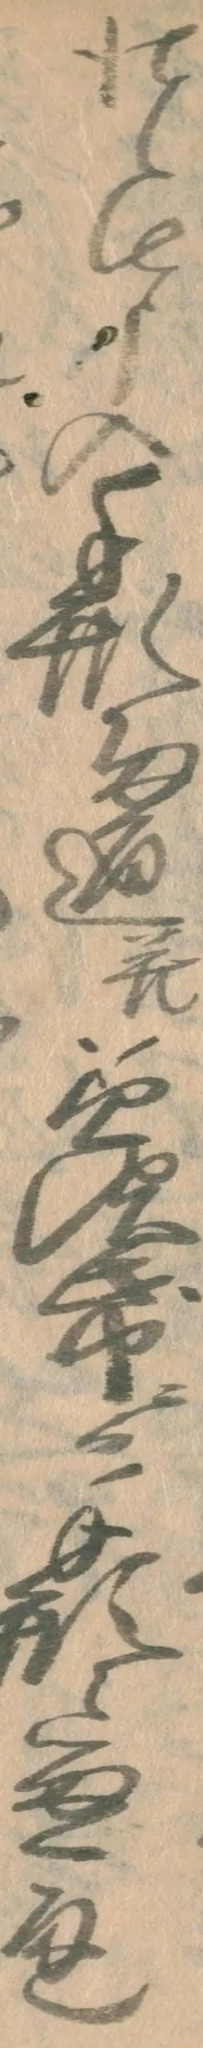仕候由申入手形両通并美濃紙ニ而手形之留一通
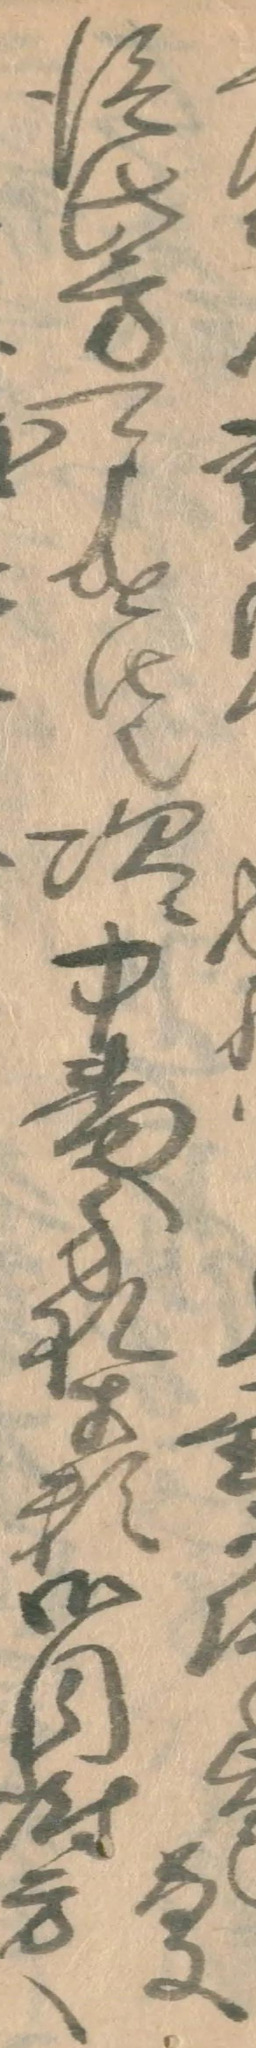従此方可申遣由也次ニ中番へ手札相頼御目附方へ
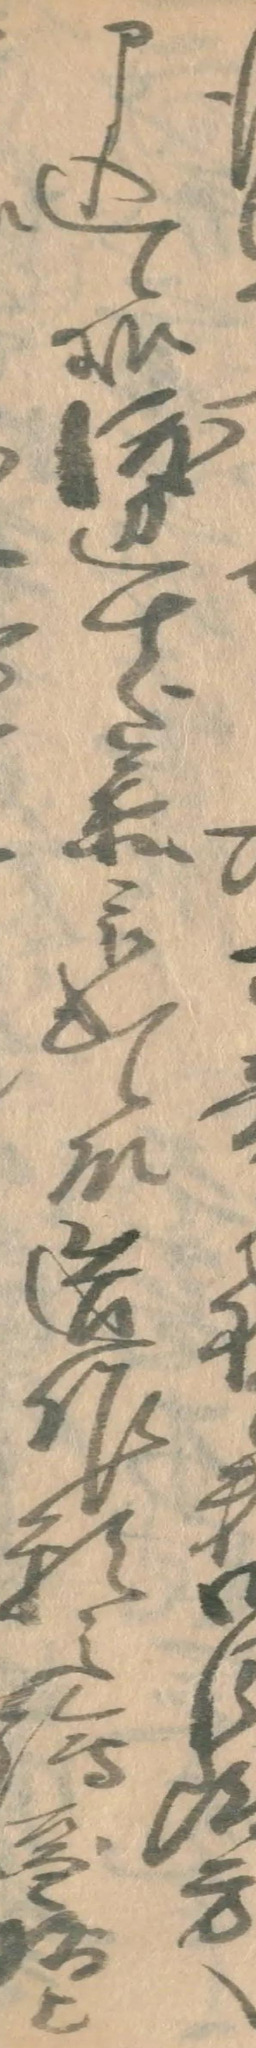申込候様渡辺十郎兵衛被出候故造作願之絵図指上
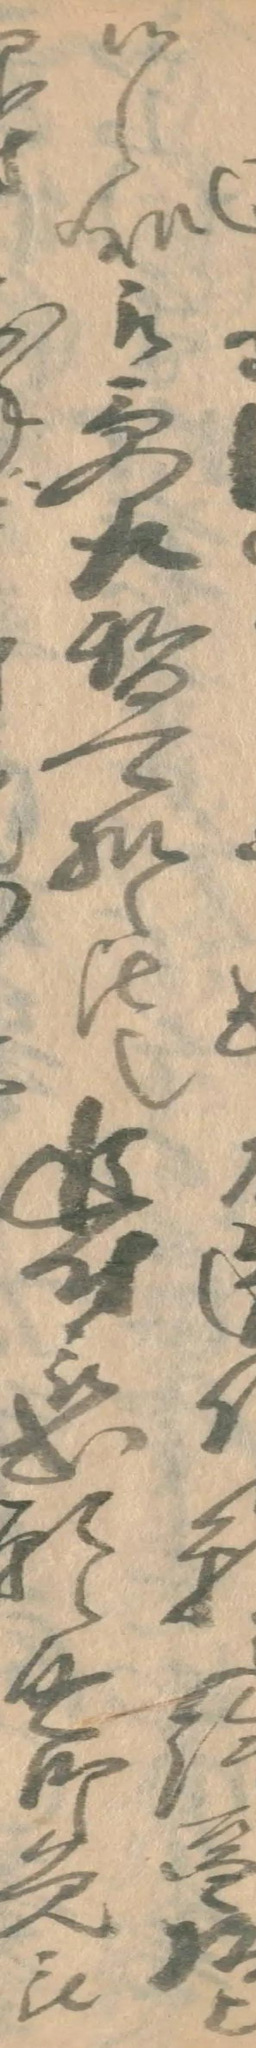候之処被受取暫可扣之由也追付被出願之通御免被
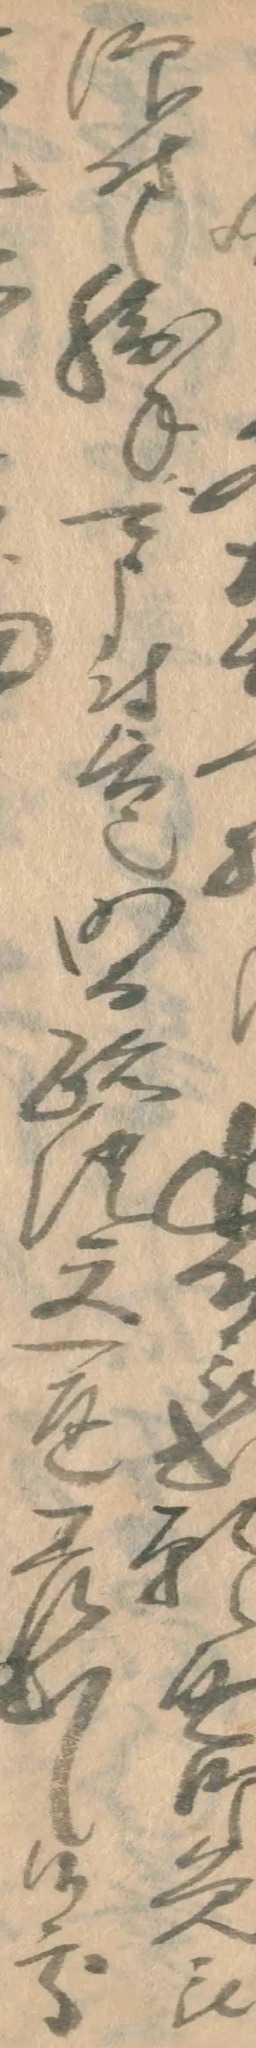仰付之勝手ニ可申付旨也仍而跡証文一通差出し候処
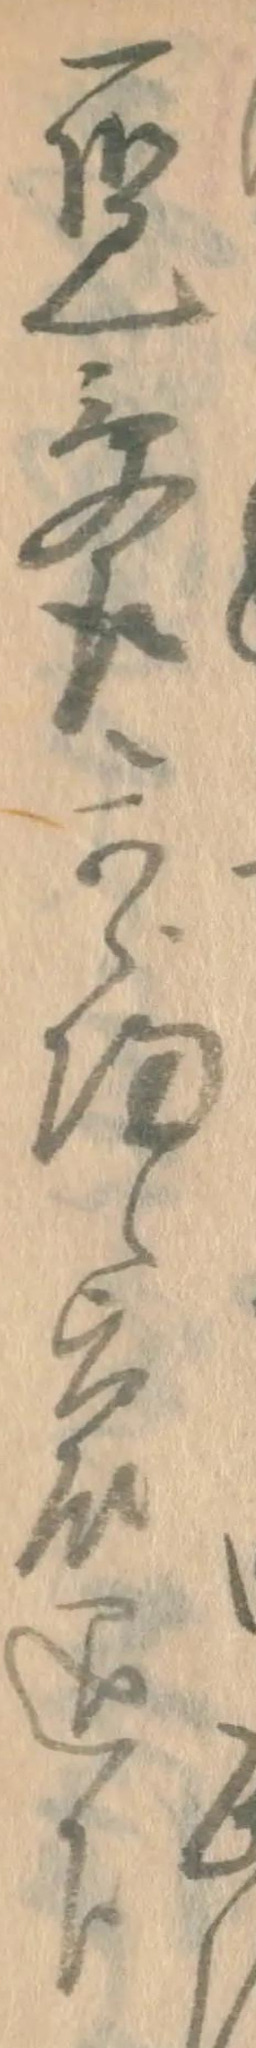一覧受取可被帰候旨故退下

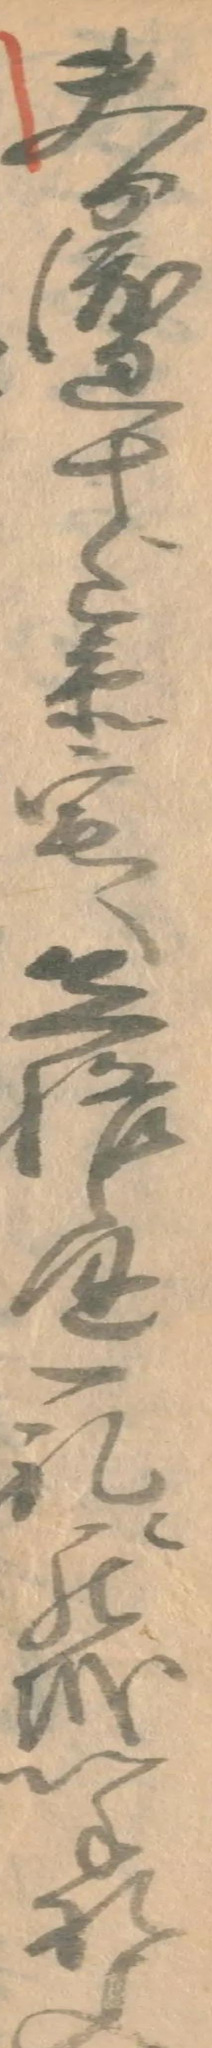夫ゟ渡辺十郎兵衛宅へ先格之通一礼ニ罷越以手札申入
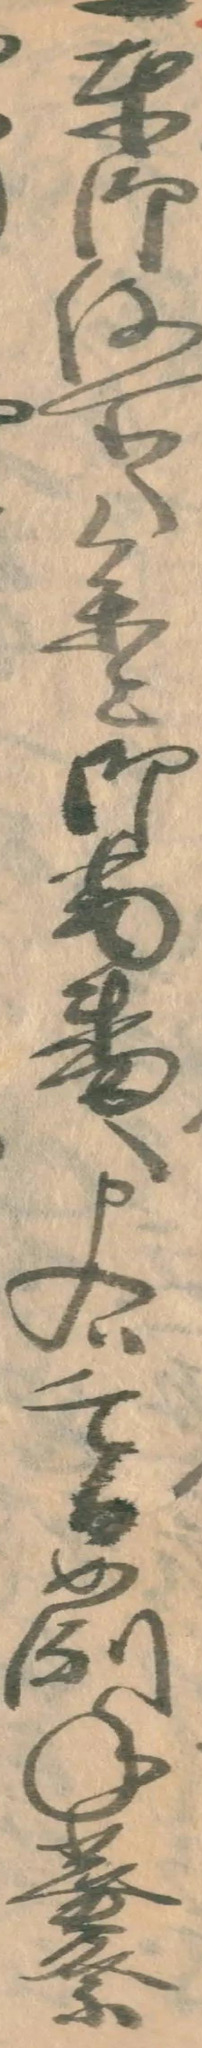一東御役所へ参上御当番へ申入ハ今日如例年葵祭
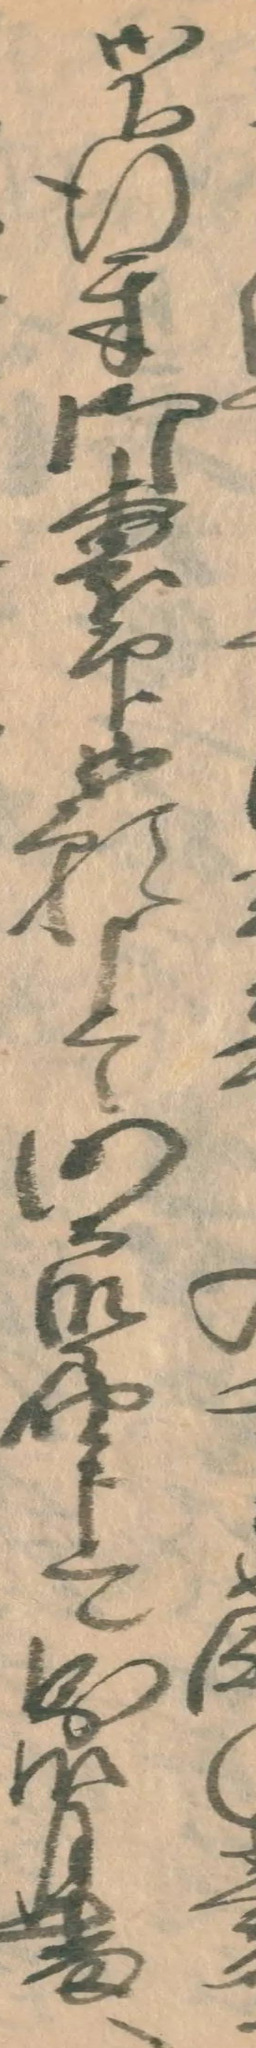御下行米御裏印御願申上候仍而御届申上候則御月番へ
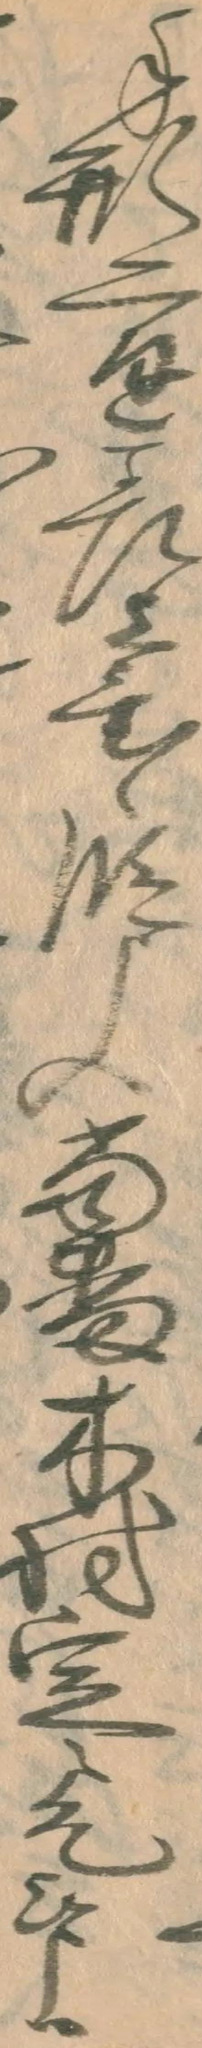手形二通差上置候段申入当番木村定之允被申候ハ
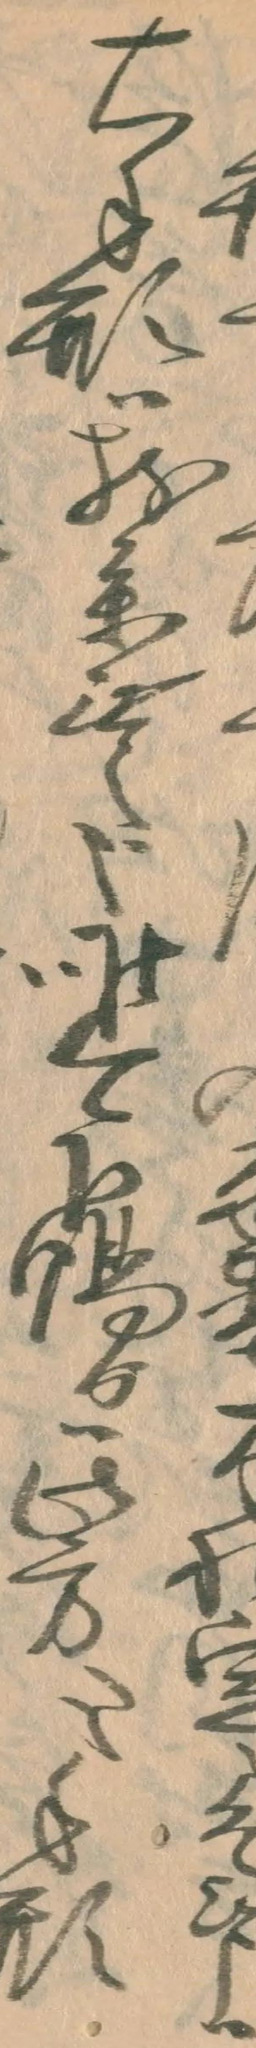右手形ハ持参無之ハ唯今下鴨ゟハ此方へも手形
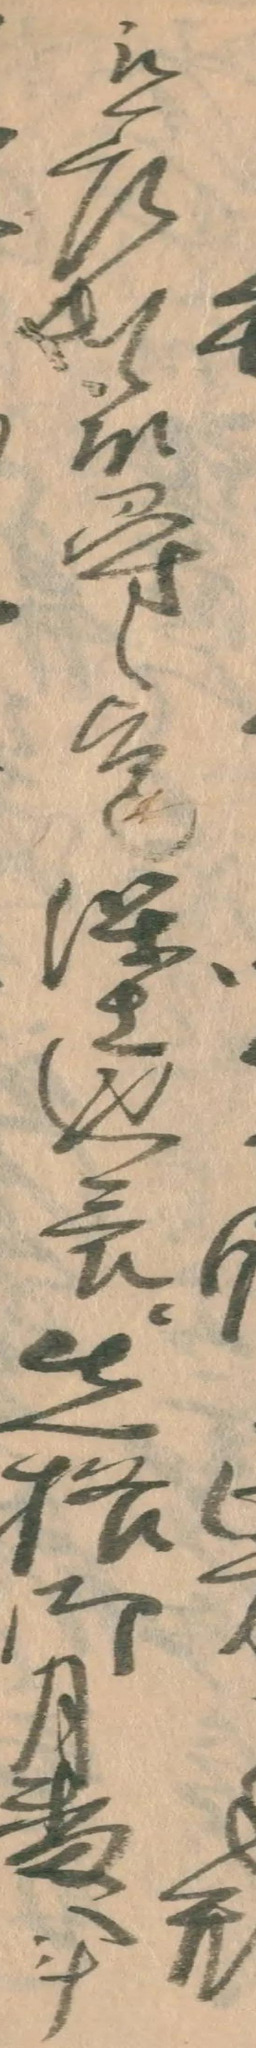被差出候故尋候旨也保土返答ニ先格御月番へ斗
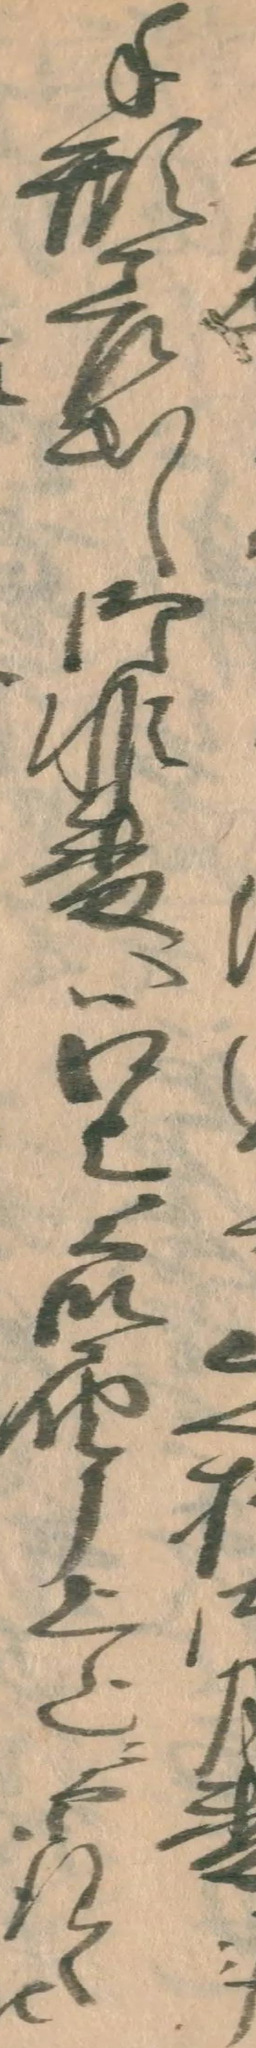手形差出し御非番へハ口上ニ而御届申上候ニ而御座候由
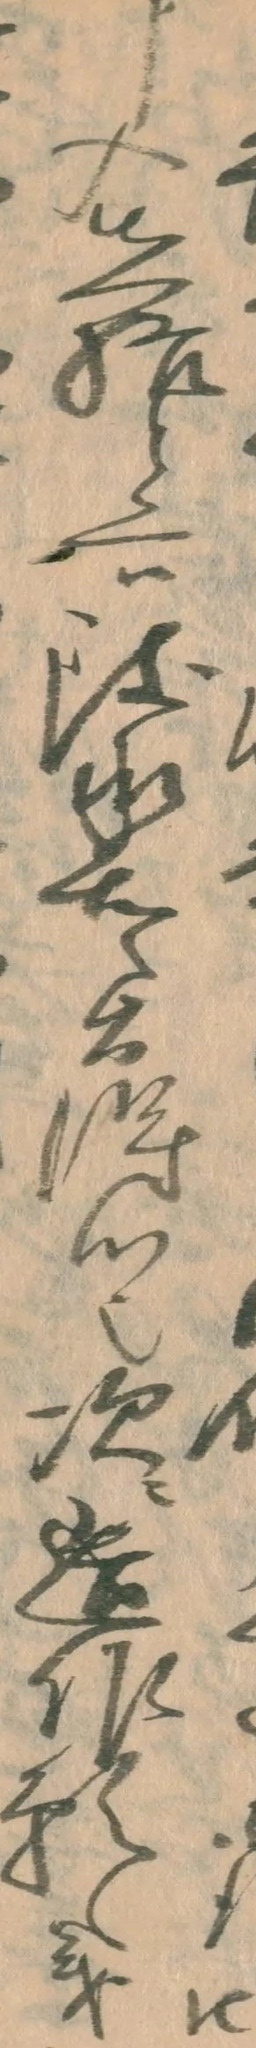申入先格ニ候ヘハ致承知之旨得心也次ニ造作願之義
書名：賀茂社記録. 第60冊
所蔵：国立国会図書館 National Diet Library, JAPAN
